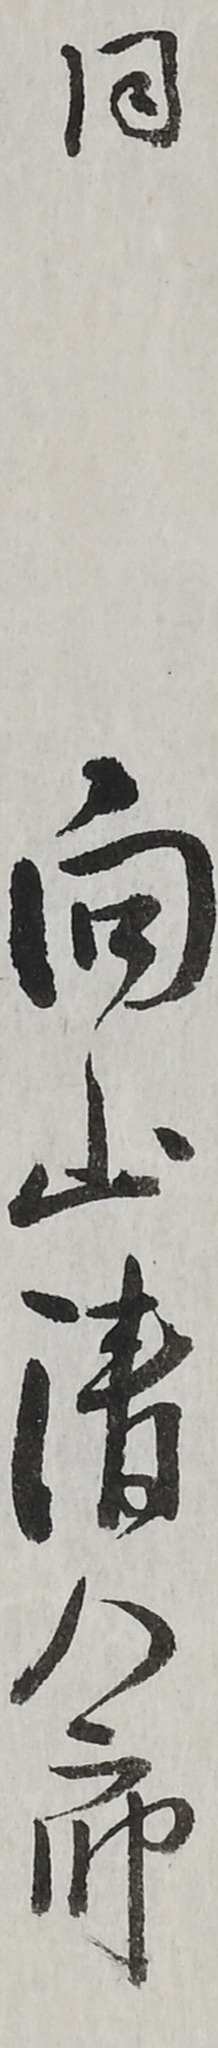同向山清八郎
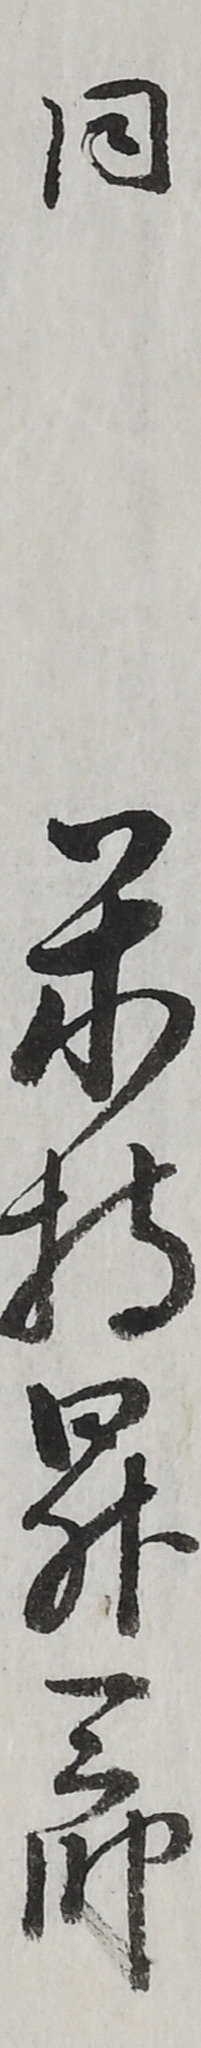同米持昇一郎
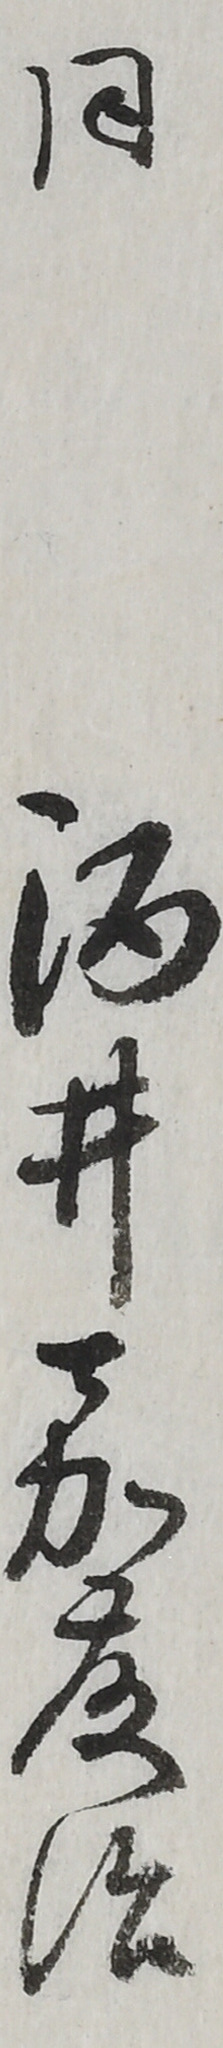同酒井嘉藤治
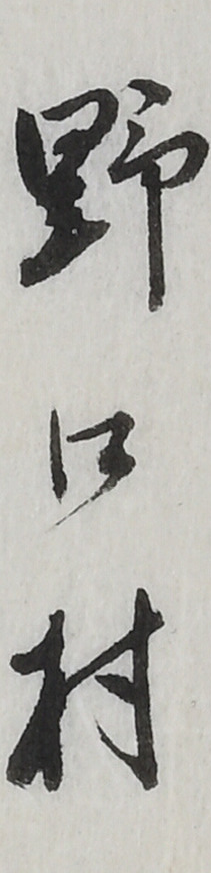野口村
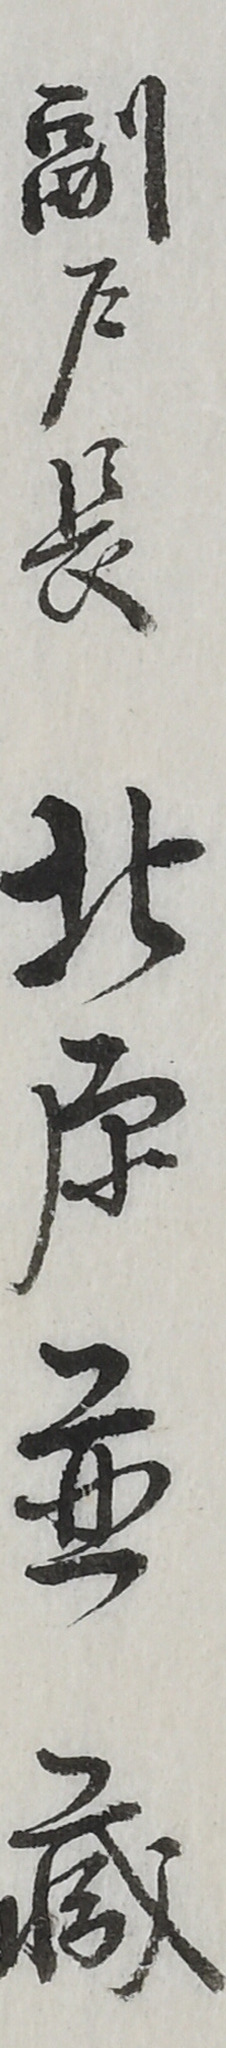副戸長北原並蔵
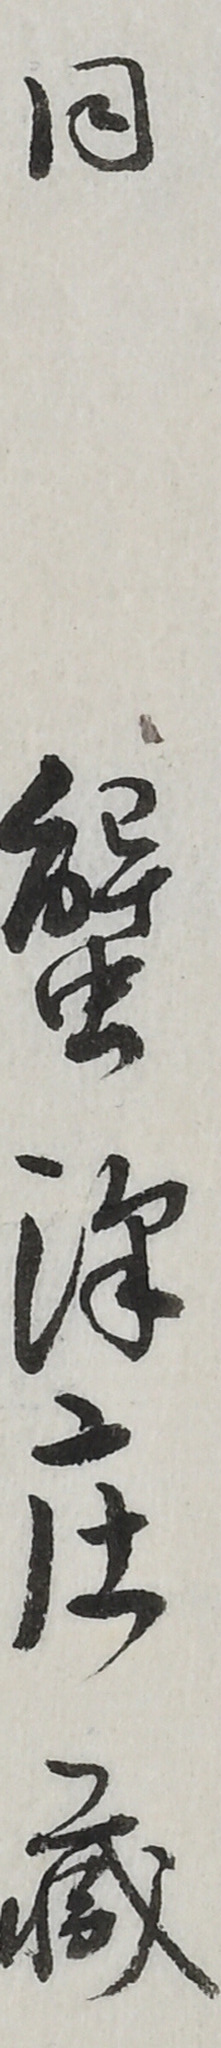同蟹澤庄蔵
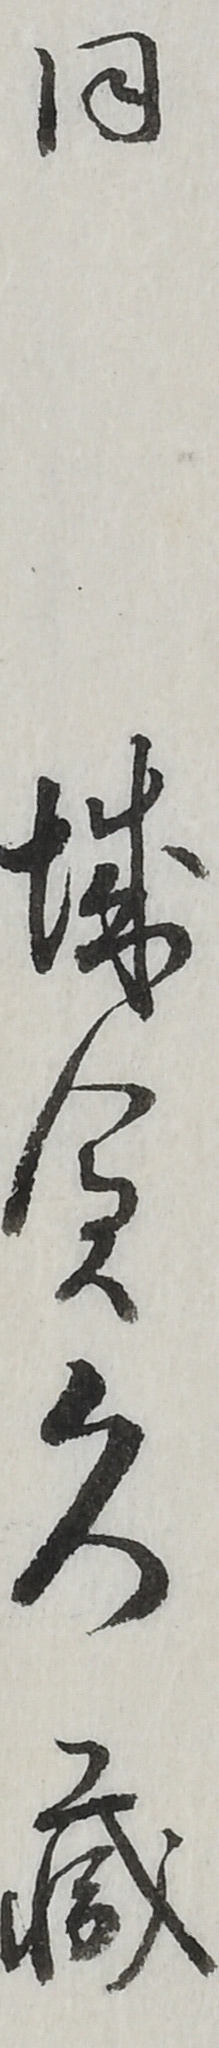同城倉久蔵
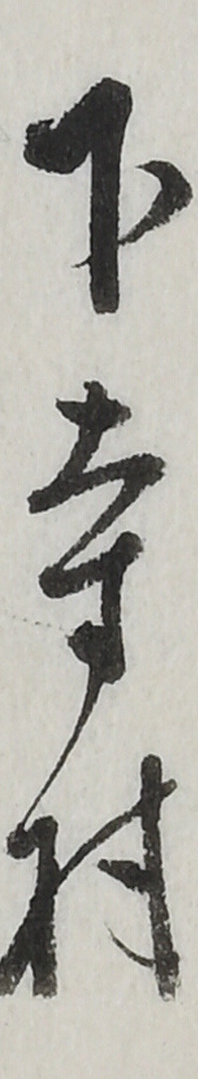下寺村
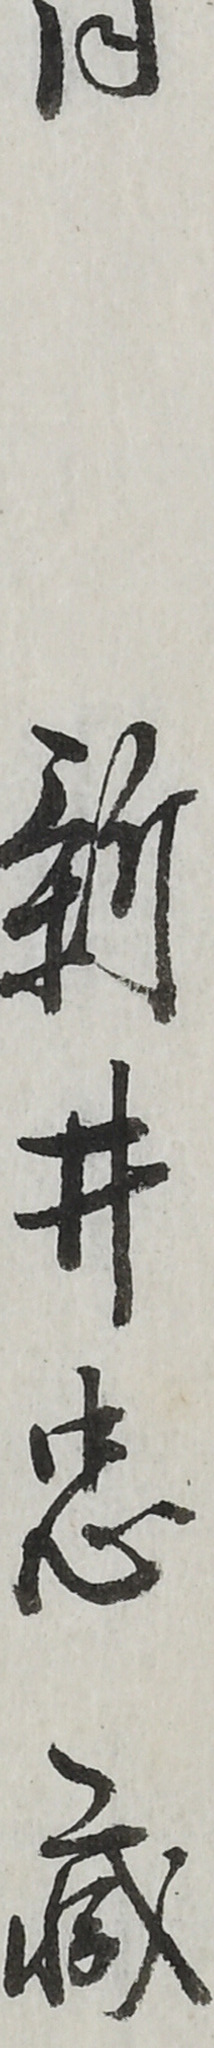同新井忠蔵
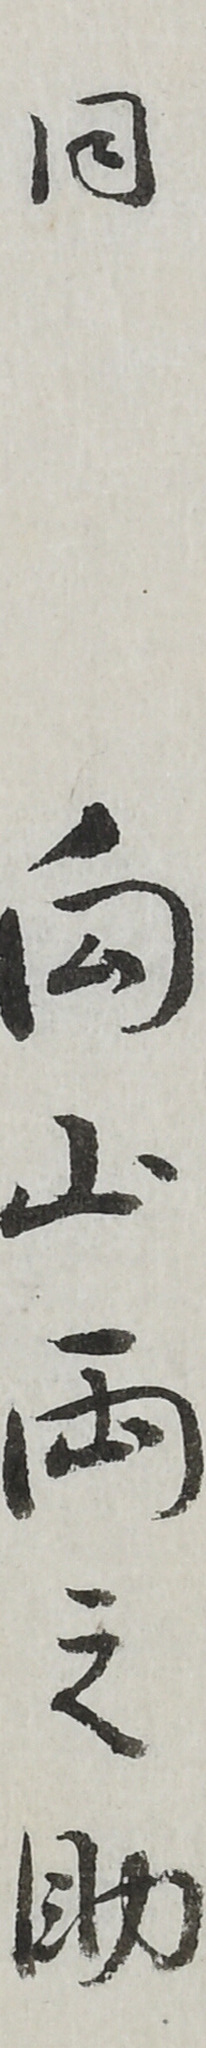同向山両之助

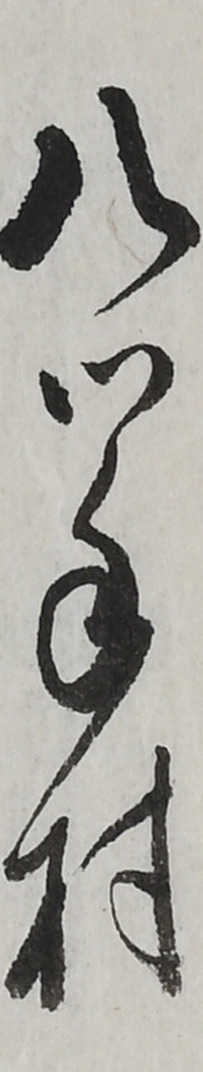八ツ手村
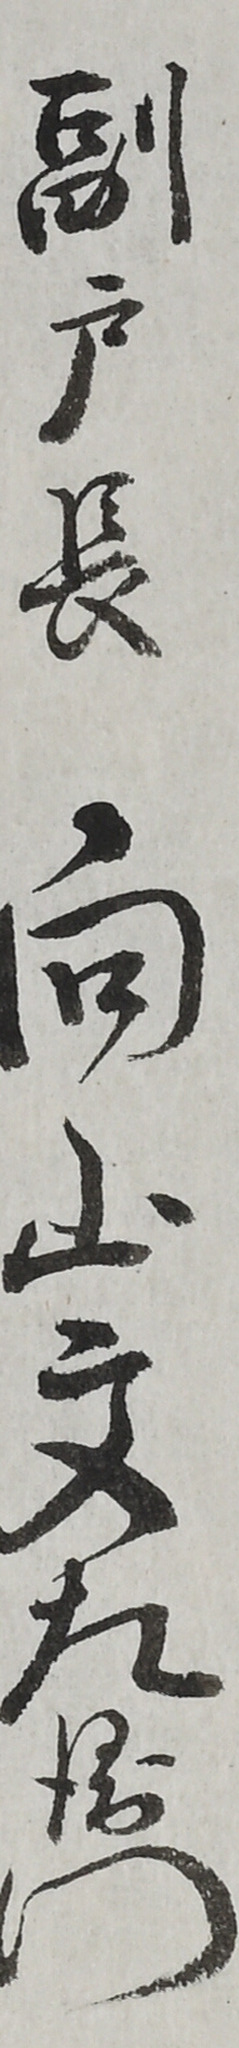副戸長向山文左衛門
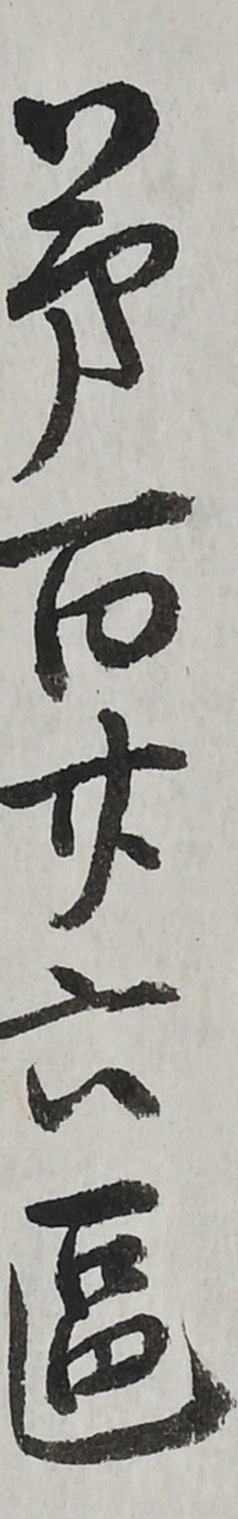第百廿六区
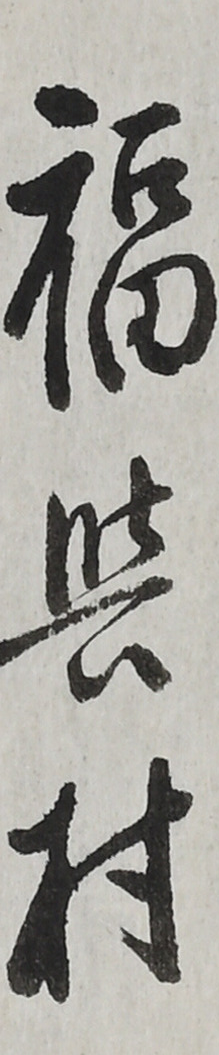福与村
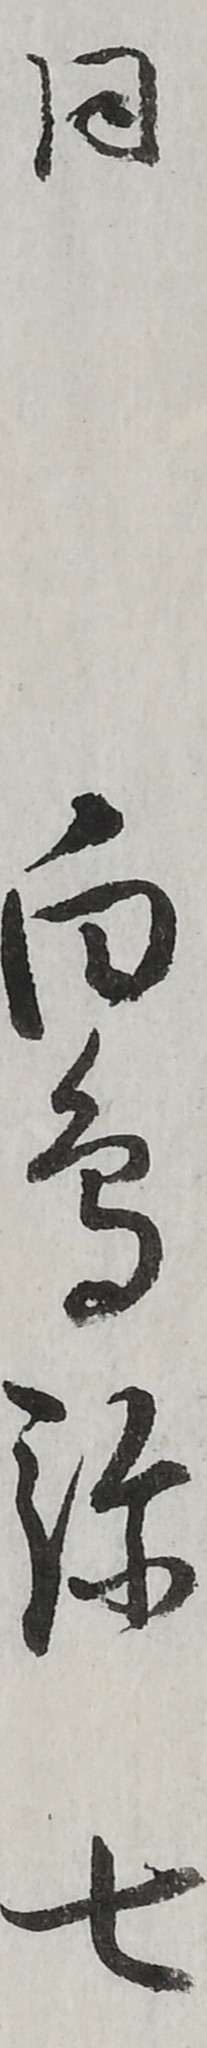同白鳥弥七
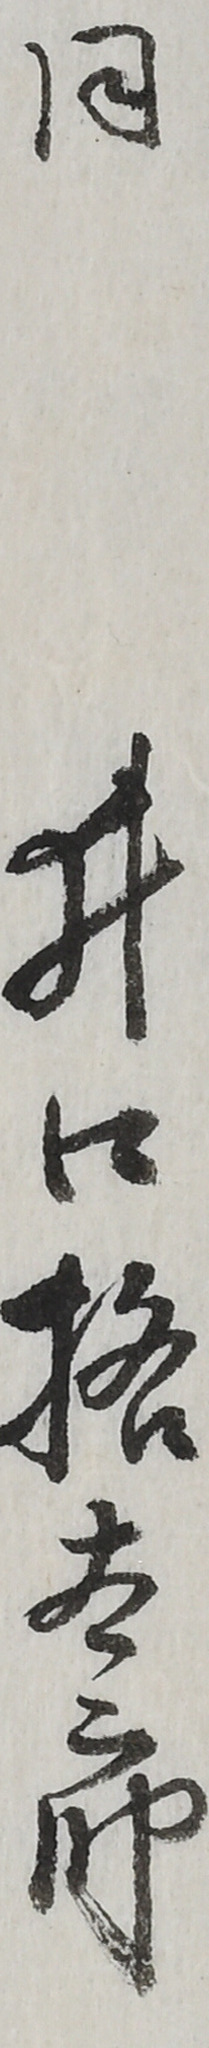同井口格太郎
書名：伊那郡毎村戸長副戸長名簿
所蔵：伊那市立高遠町図書館・合同会社AMANE
